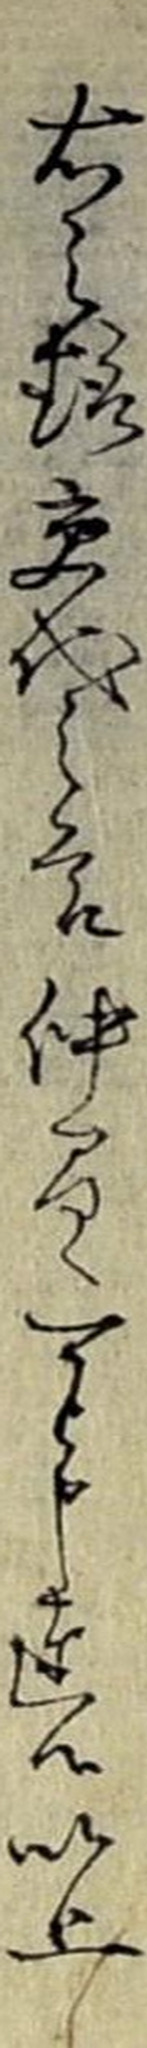右之趣交代之節仲間へ可被申達候以上
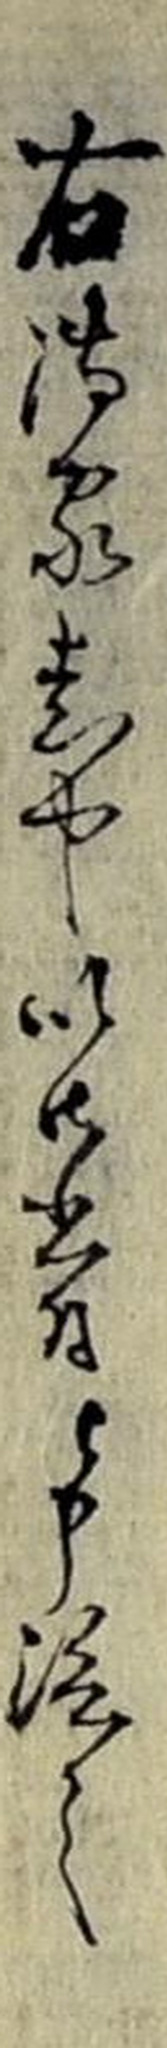右御家老中以御書付被申渡之
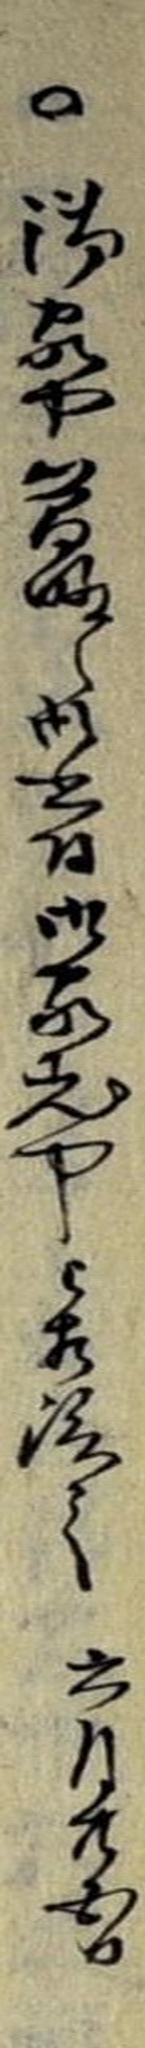〇御家中簡略之御書付御家老中被相渡之六月廿五日
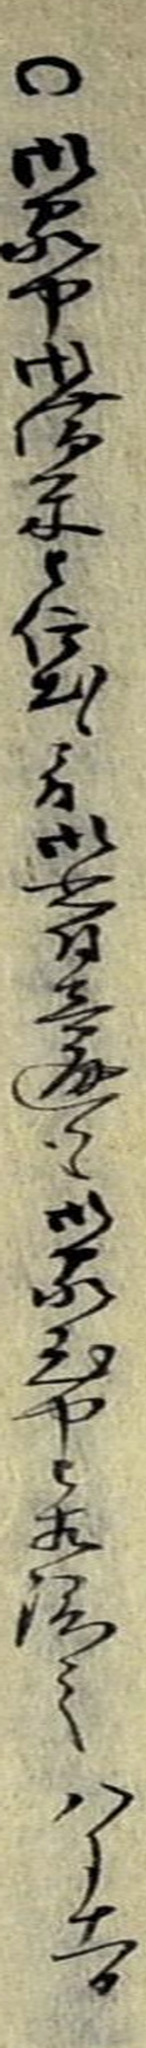〇御家中御借米被仰出候ニ付御書付壱通ツヽ御家老中被相渡之八月十一日

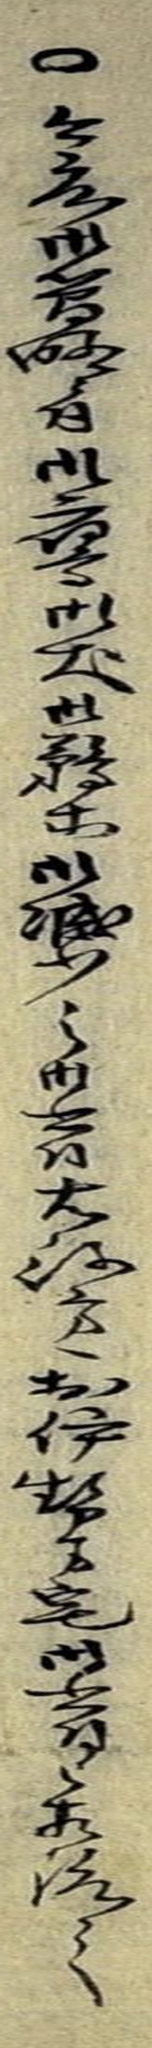〇今度御簡略ニ付御鷹御犬御鵜等御減少之御書付右役方へ於伊勢方宅御書付被相渡之
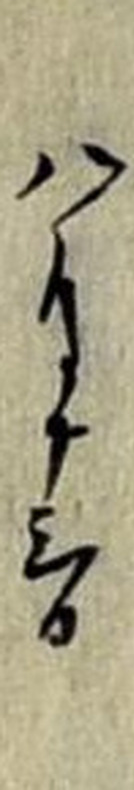八月十三日
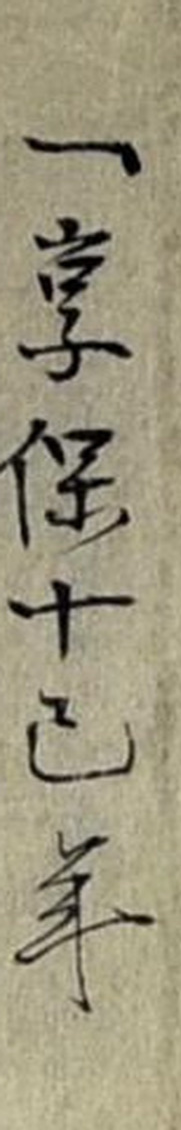一享保十巳年
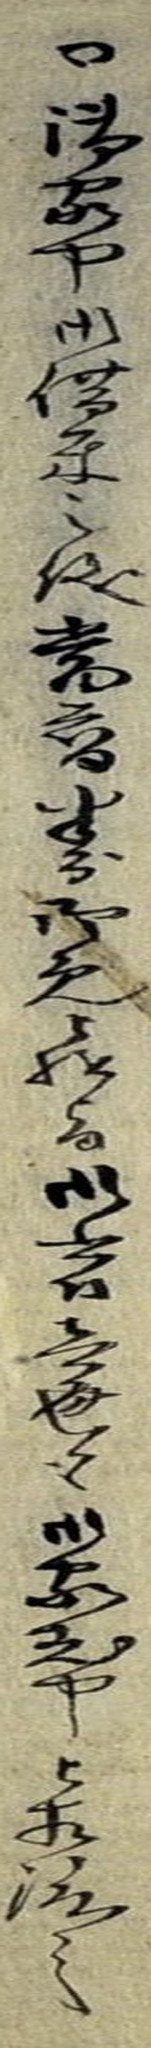〇御家中御借米之儀当暮半分御免被遊旨御書付壱通ツヽ御家老中被相渡之
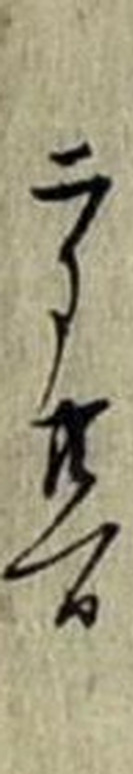二月廿一日
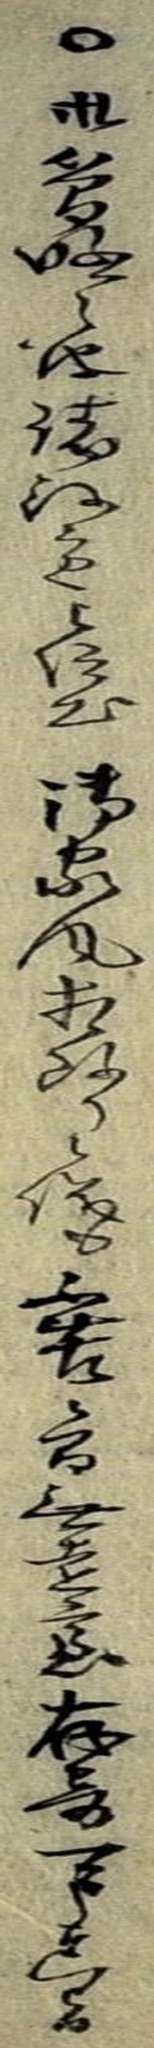〇御簡略之儀諸役方へ被仰出御家風相改り候儀も不苦候間無遠慮存寄可申達旨
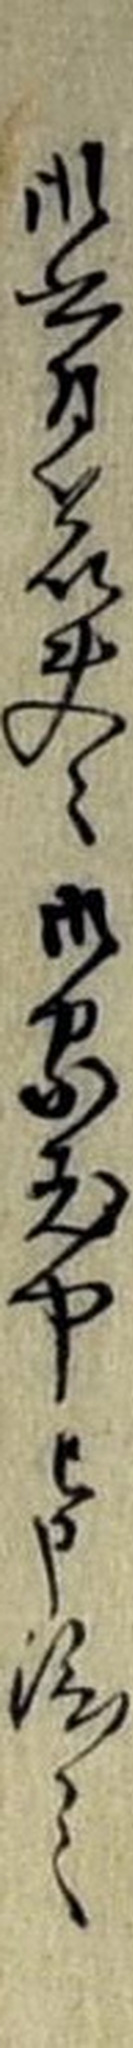御書付を以夫々御家老中被申渡之
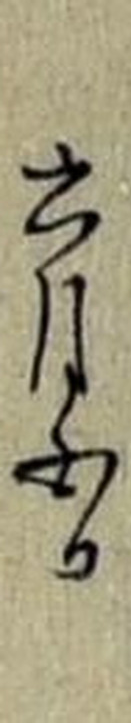六月五日
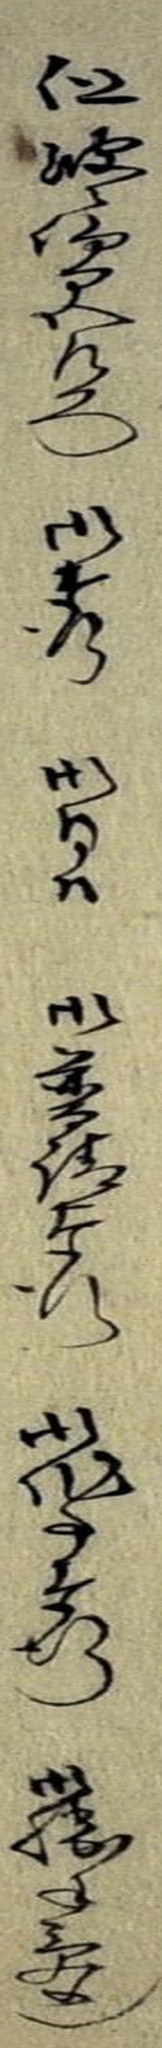但波々伯部八左衛門御奉行御目付御普請奉行御作事奉行御勝手受込
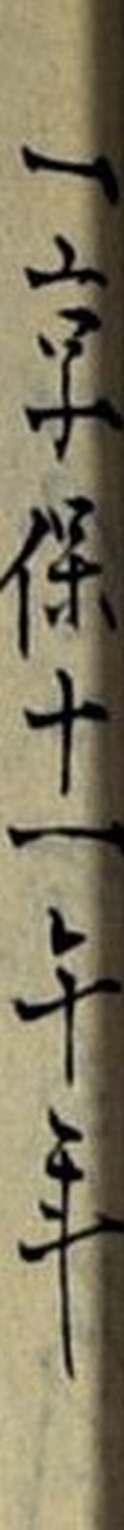一享保十一午年
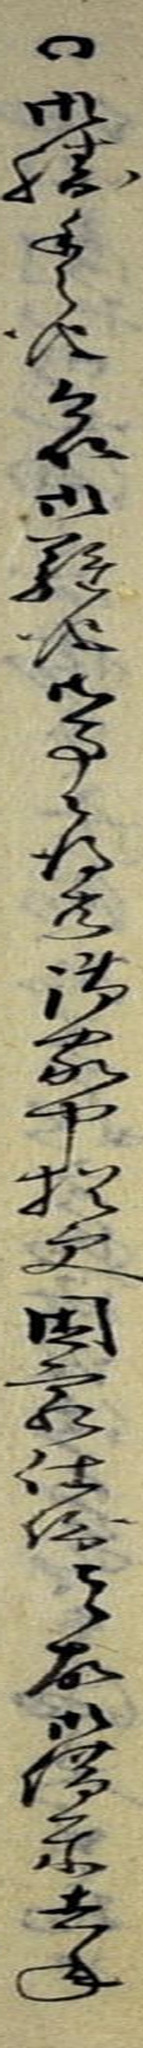〇御勝手之儀今以御難儀候事ニ候得共御家中猶更困窮仕儀ニ候故御借米去年
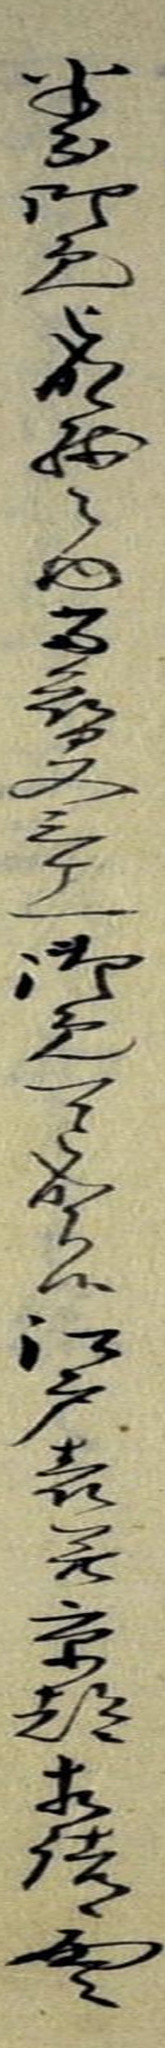半分御免被成候残之内当暮又三ケ一御免可被成下候江戸表并京都相詰候面々
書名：命令之部 一
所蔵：福井県文書館 Fukui Prefectural Archives
